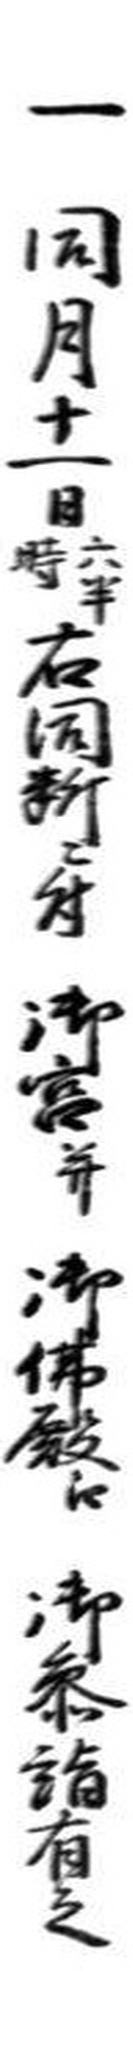一同月十一日六半時右同断ニ付御宮并御仏殿江御参詣有之
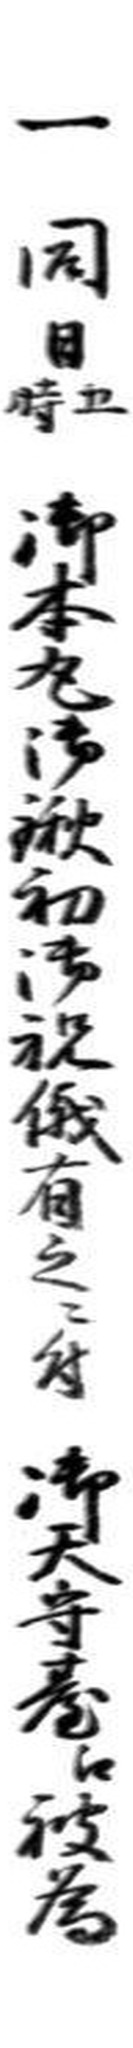一同日五時御本丸御鍬初御祝儀有之ニ付御天守台江被為
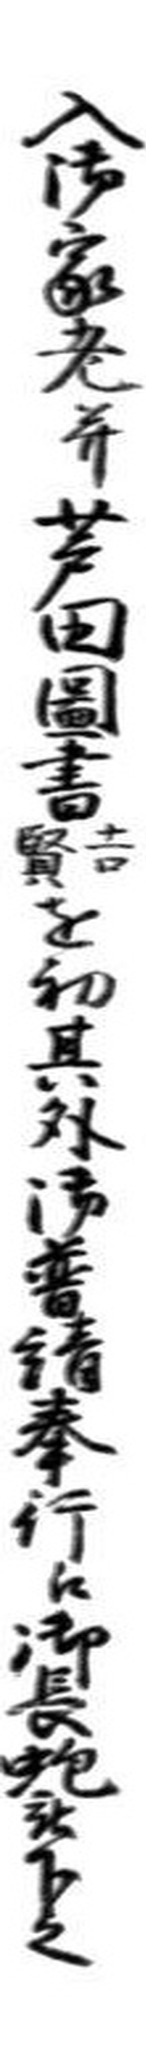入御家老并芦田図書吉賢を初其外御普請奉行江御長蚫被下之
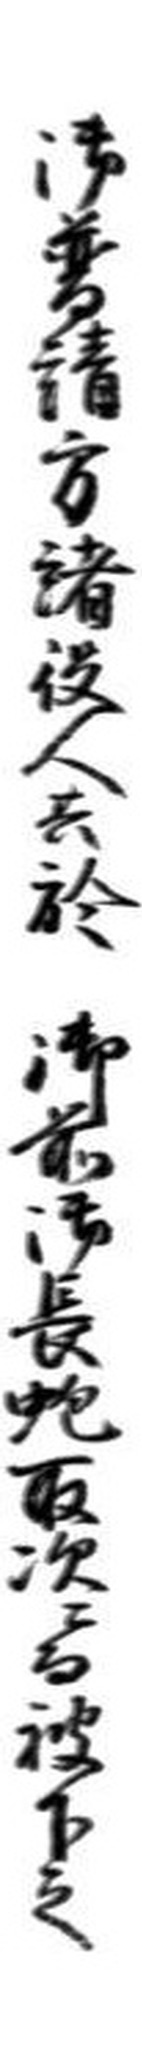御普請方諸役人共於御前御長蚫取次ニ而被下之
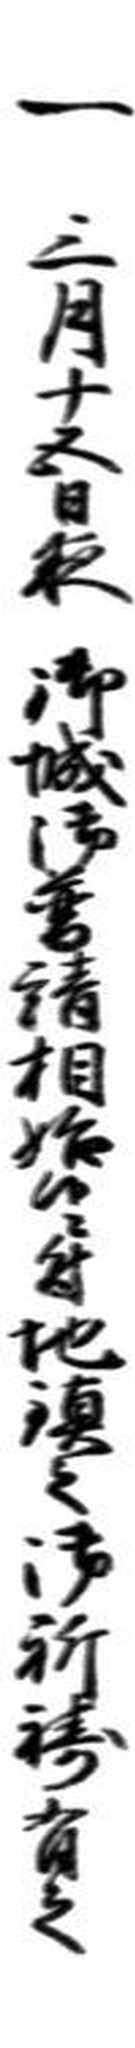一三月十五日夜御城御普請相始候ニ付地鎮之御祈祷有之
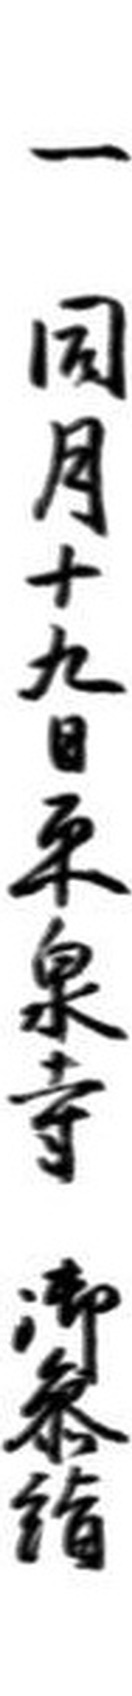一同月十九日平泉寺御参詣
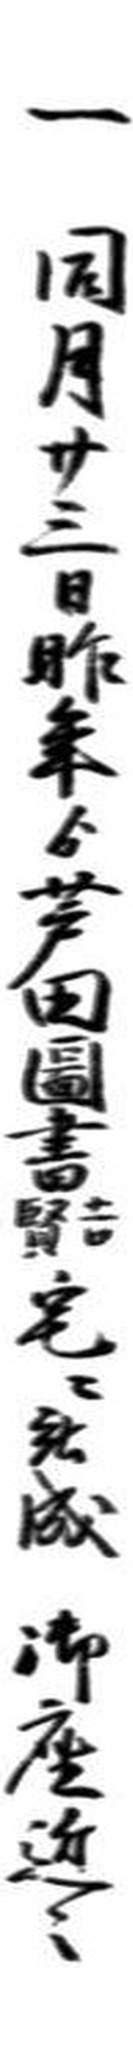一同月廿三日昨年ゟ芦田図書吉賢宅ニ被成御座近々
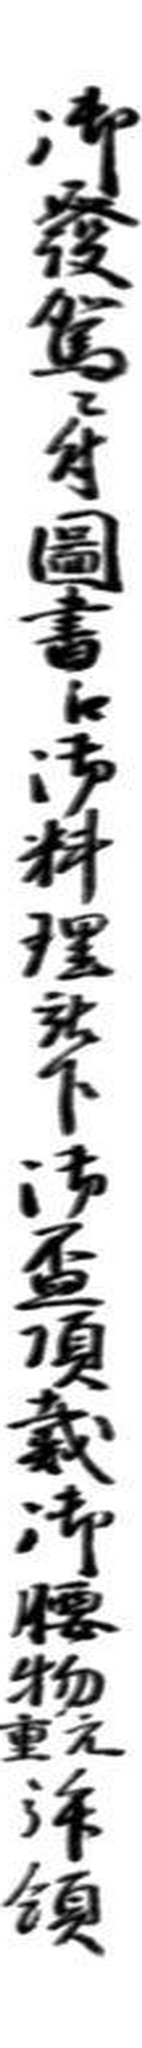御発駕ニ付図書江御料理被下御盃頂戴御腰物元重拝領
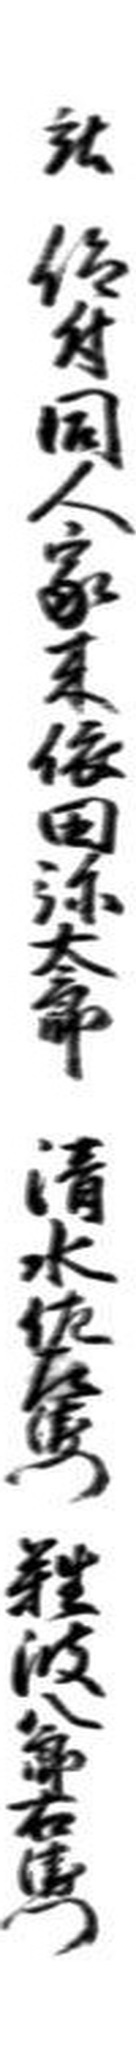被仰付同人家来依田弥太郎清水佐左衛門難波八郎右衛門
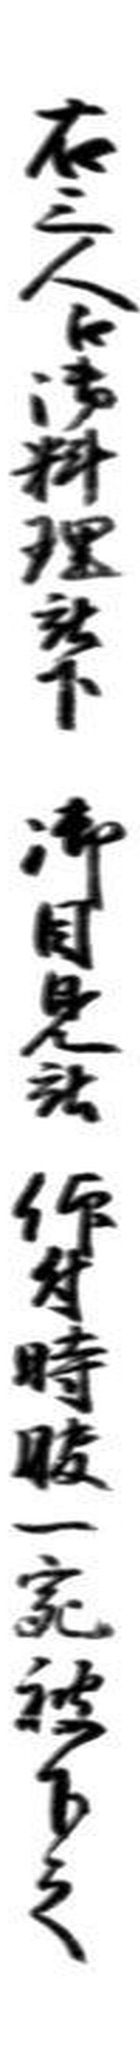右三人江御料理被下御目見被仰付時服一宛被下之

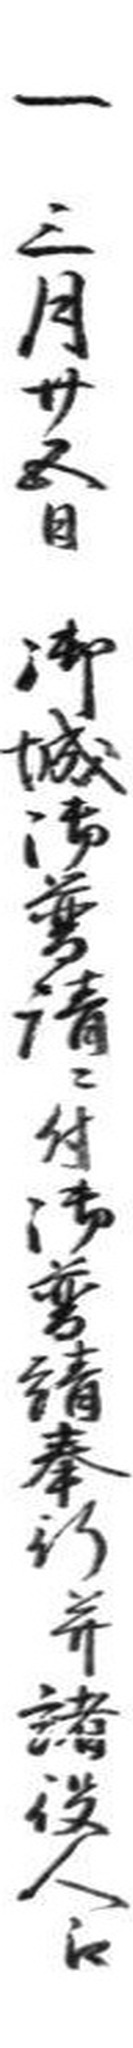一三月廿五日御城御普請ニ付御普請奉行并諸役人江
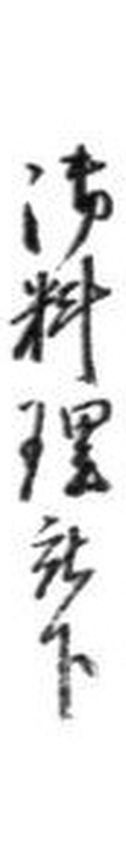御料理被下
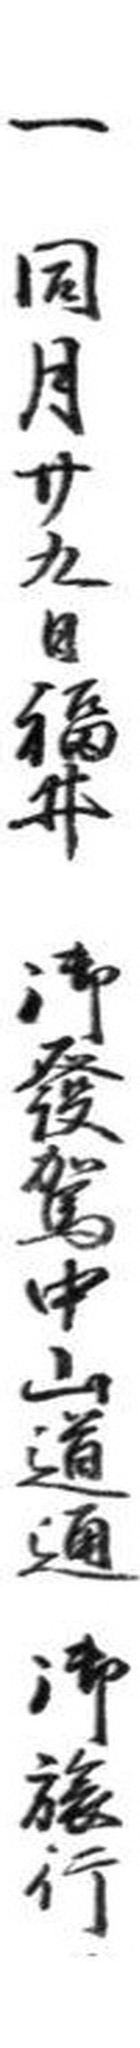一同月廿九日福井御発駕中山道通御旅行
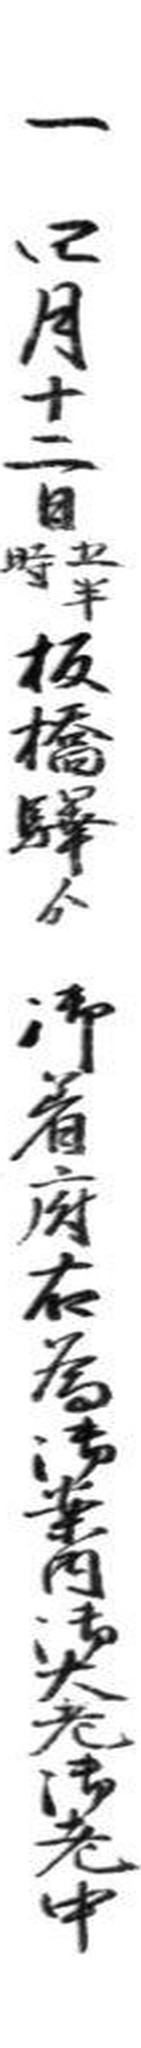一四月十二日五半時板橋駅ゟ御着府右為御案内御大老御老中
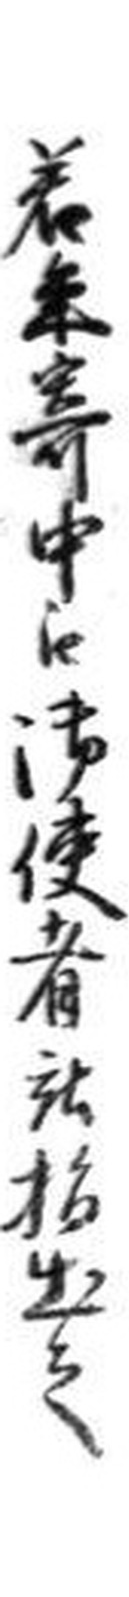若年寄中江御使者被指出之
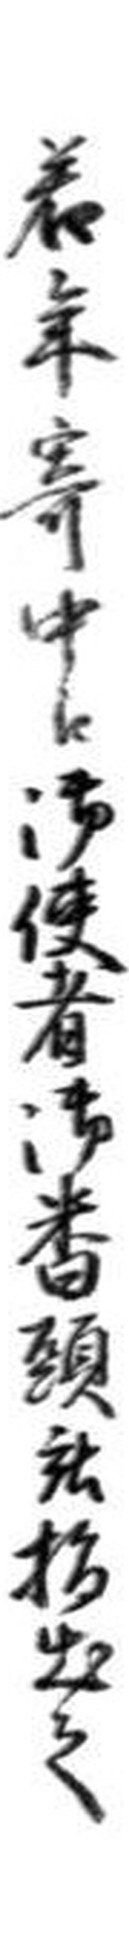若年寄中江御使者御番頭被指出之
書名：家譜 八 光通公 従寛文十年到同十二年
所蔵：福井県文書館 Fukui Prefectural Archives
